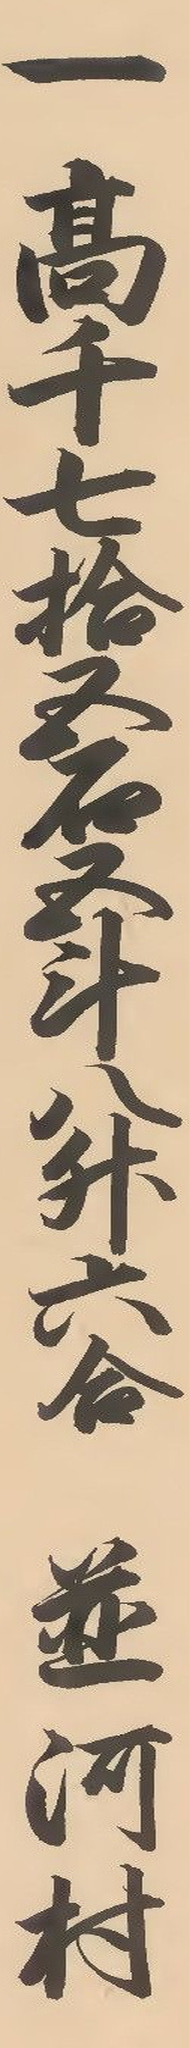一高千七拾五石五斗八升六合並河村
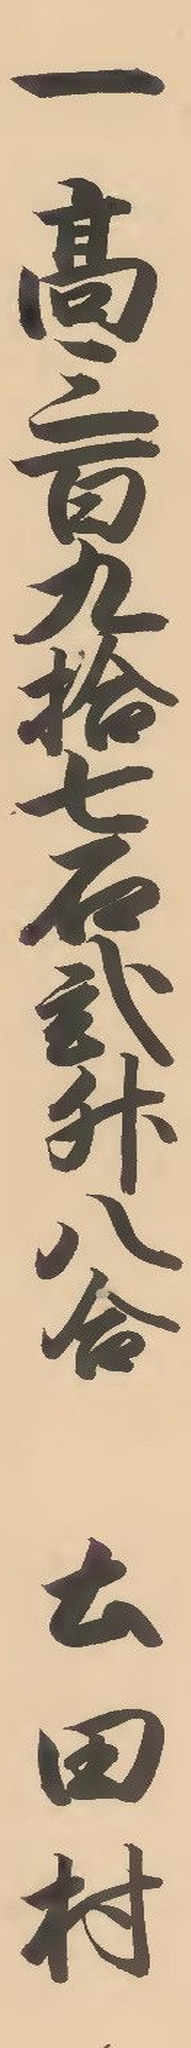一高三百九拾七石弐升八合土田村

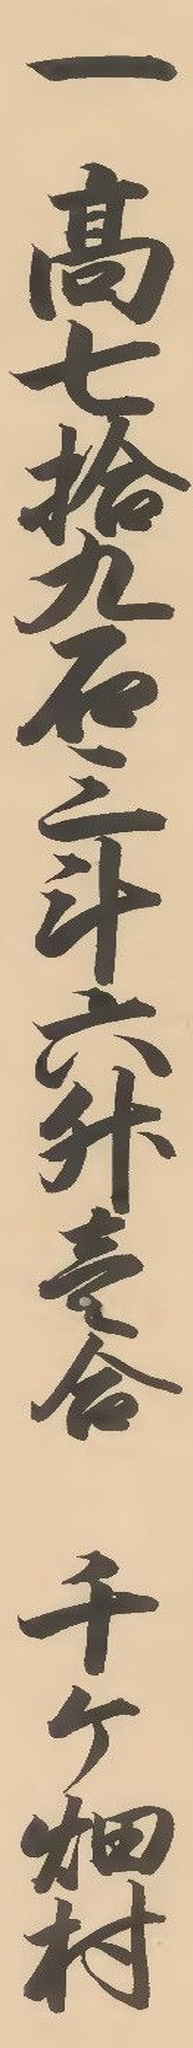一高七拾九石三斗六升壱合千ヶ畑村
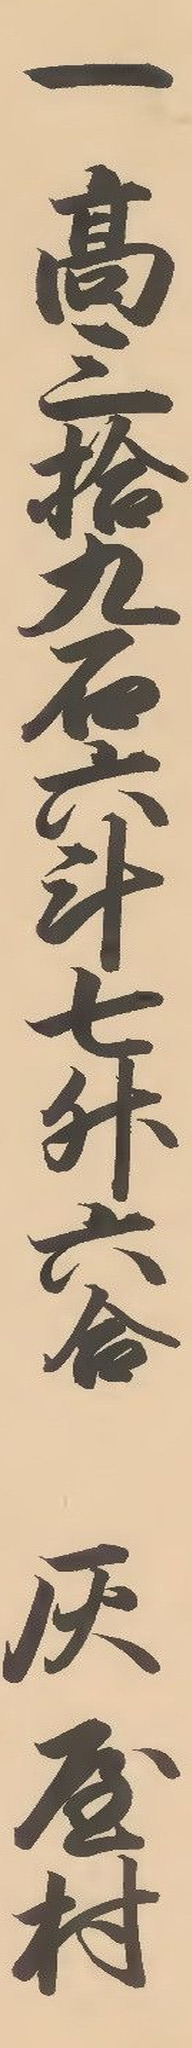一高三拾九石六斗七升六合灰屋村
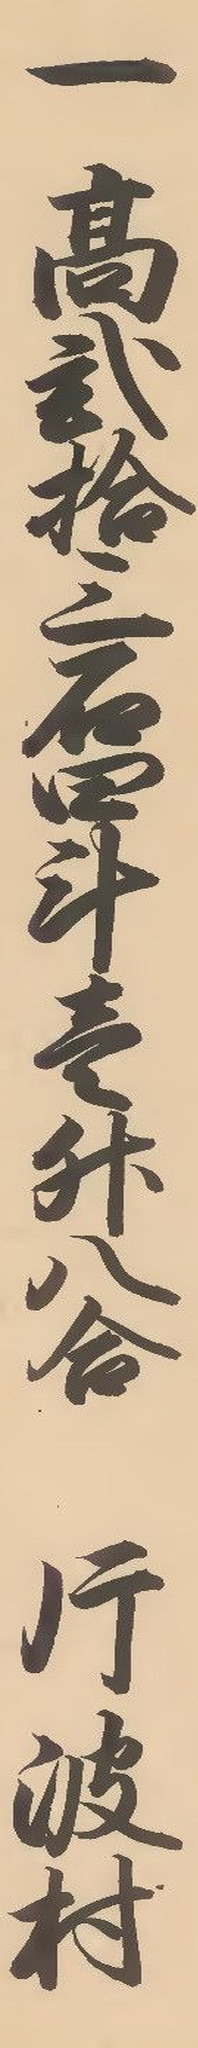一高弐拾三石四斗壱升八合片波村
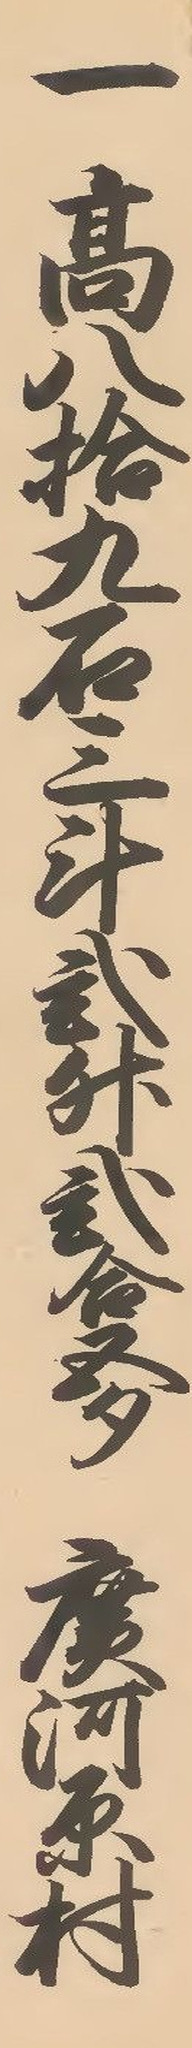一高八拾九石三斗弐升弐合五勺広河原村
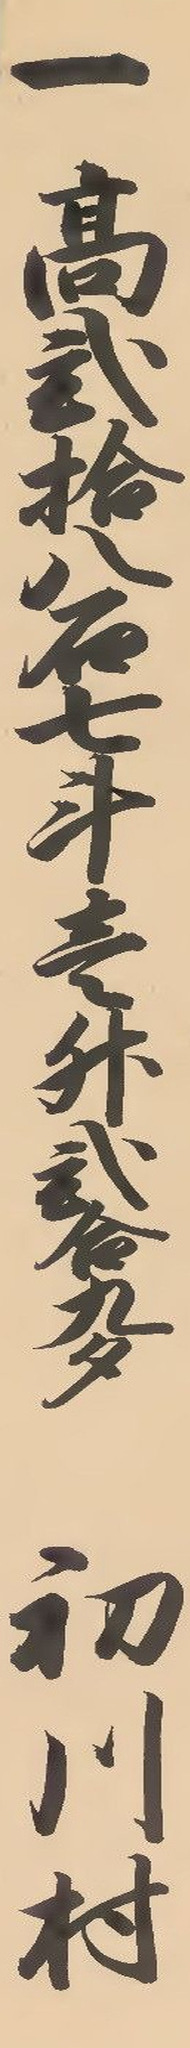一高弐拾八石七斗壱升弐合九勺初川村
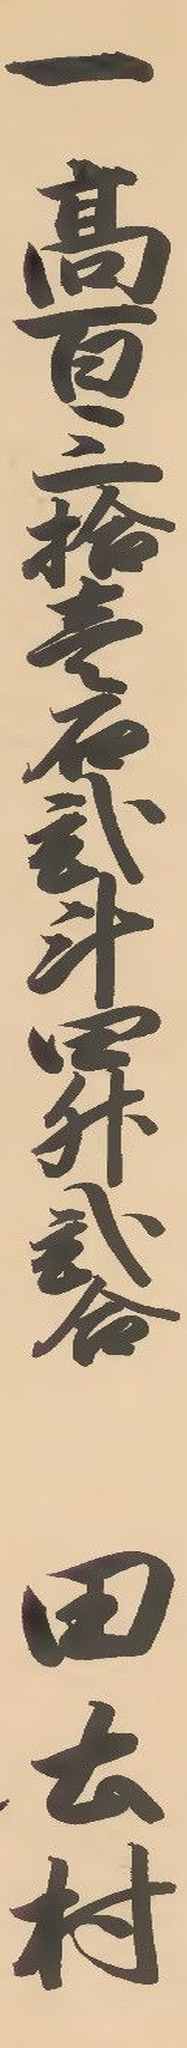一高百三拾壱石弐斗四升弐合田土村
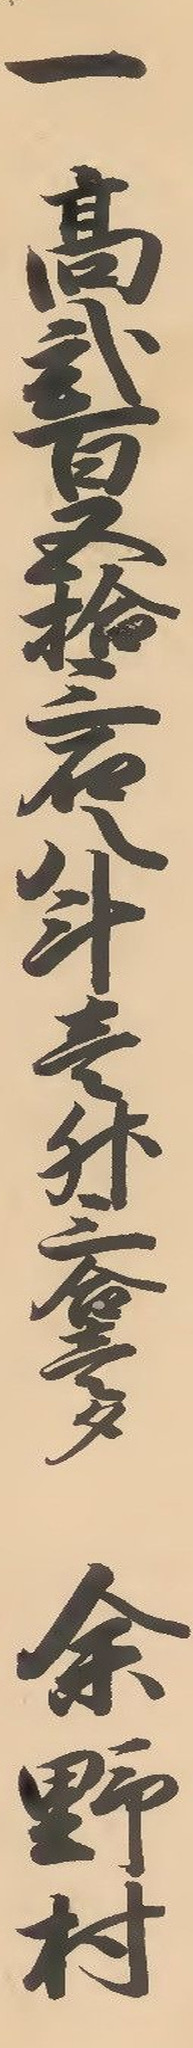一高弐百五拾三石八斗壱升三合壱勺余野村

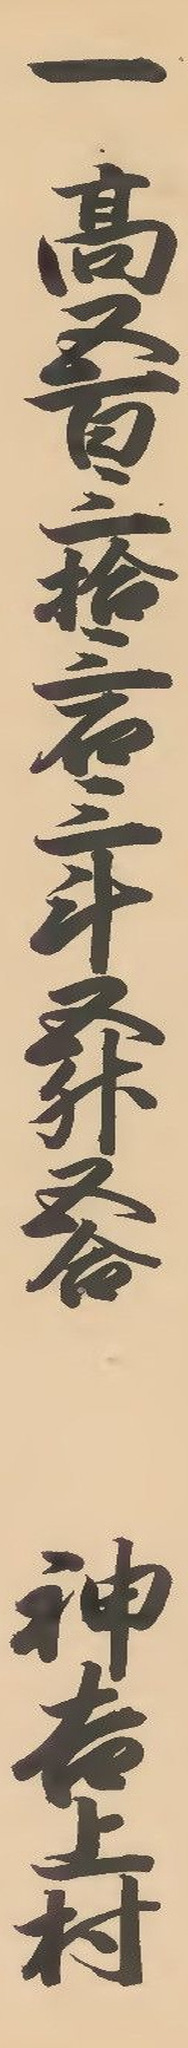一高五百三拾三石三斗五升五合神吉上村
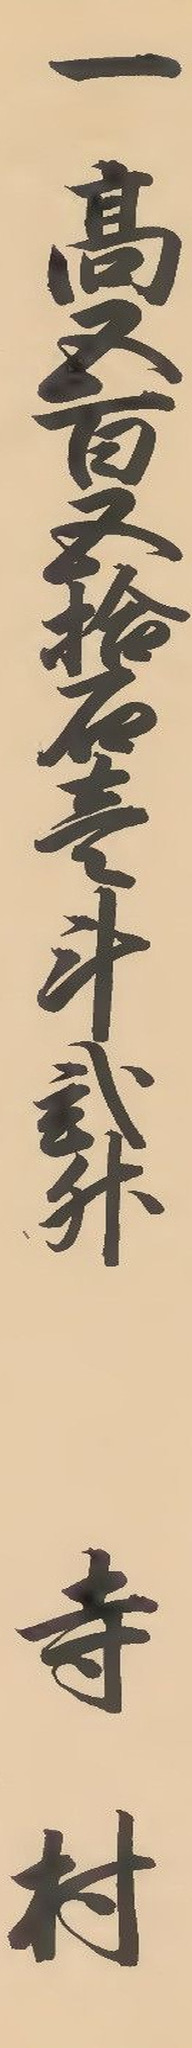一高五百五拾石壱斗弐升寺村
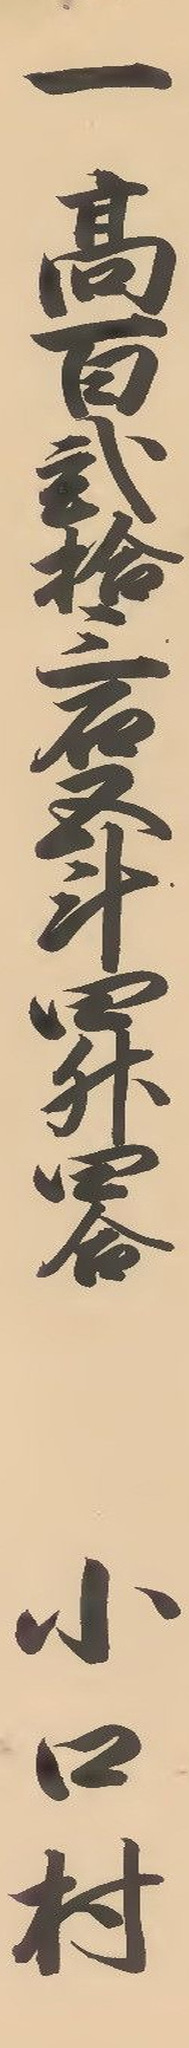一高百弐拾三石五斗四升四合小口村
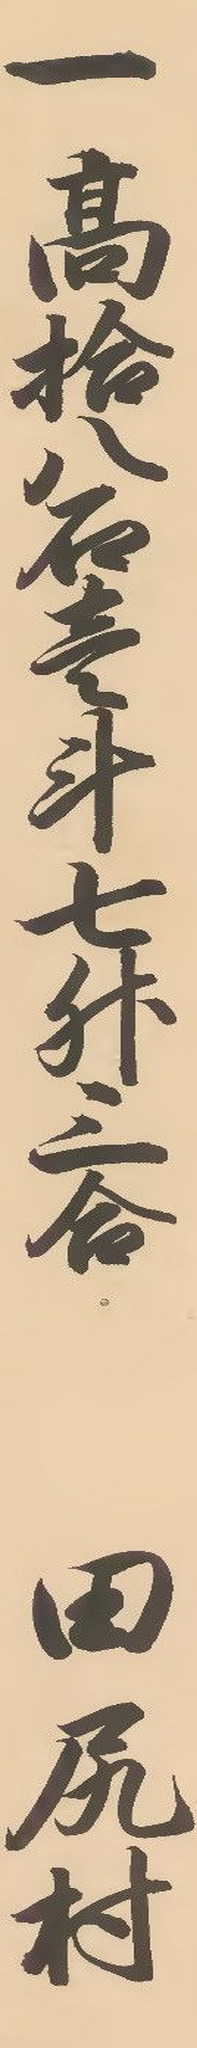一高拾八石壱斗七升三合田尻村

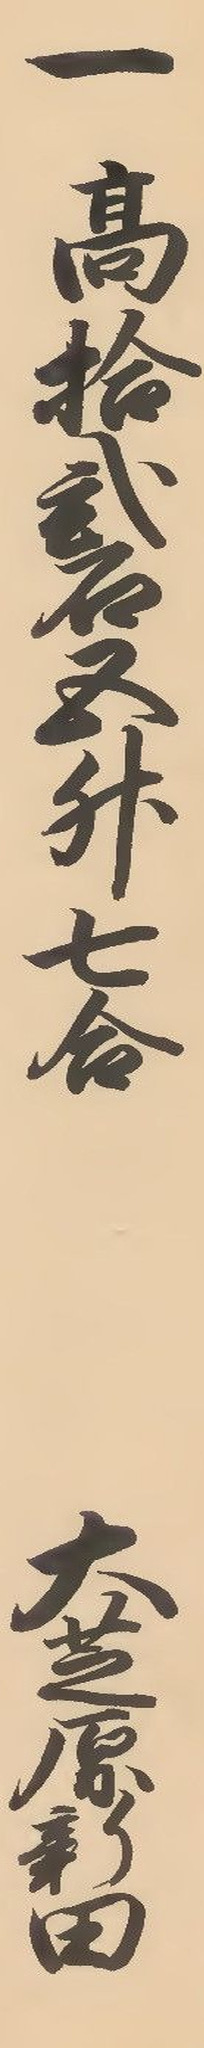一高拾弐石五升七合大芝原新田
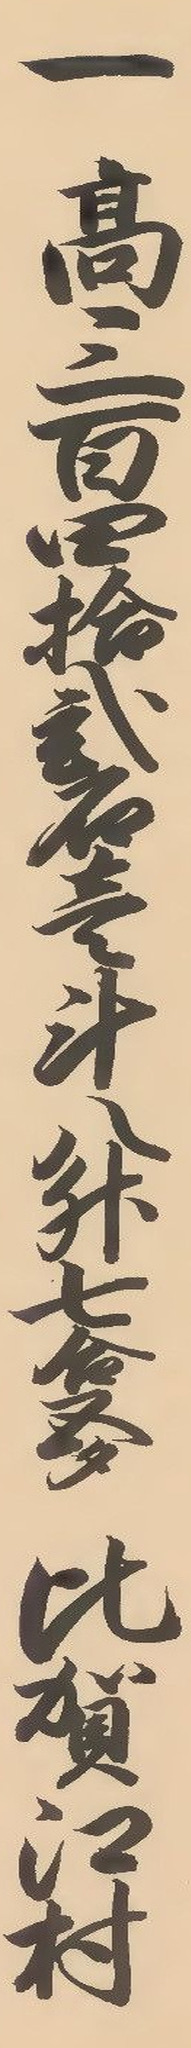一高三百四拾弐石壱斗八升七合五勺比賀江村
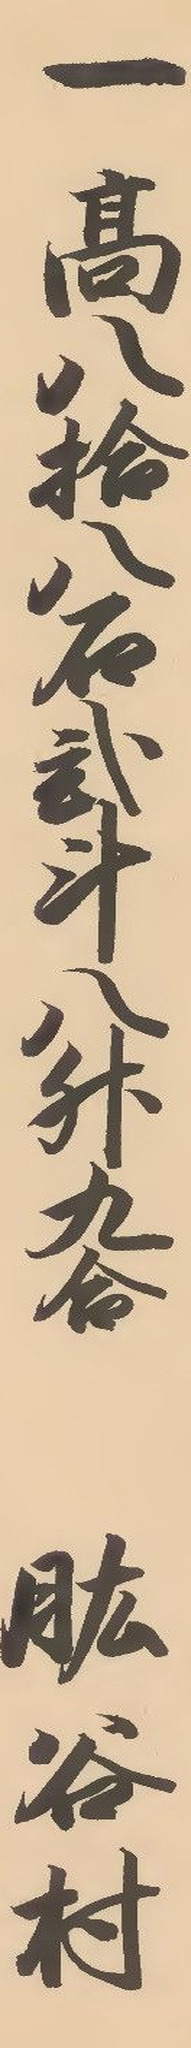一高八拾八石弐斗八升九合肱谷村
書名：丹波国郷帳
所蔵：国立公文書館 National Archives of Japan
